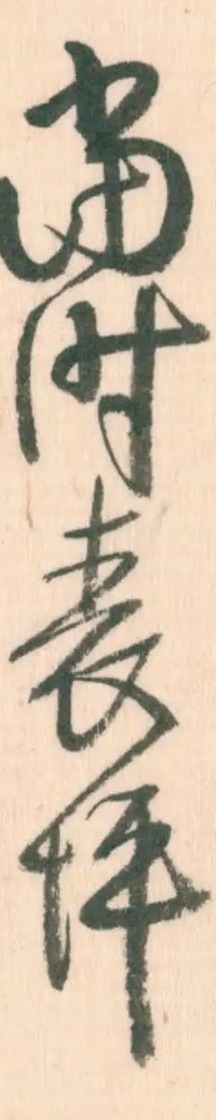当時表坪
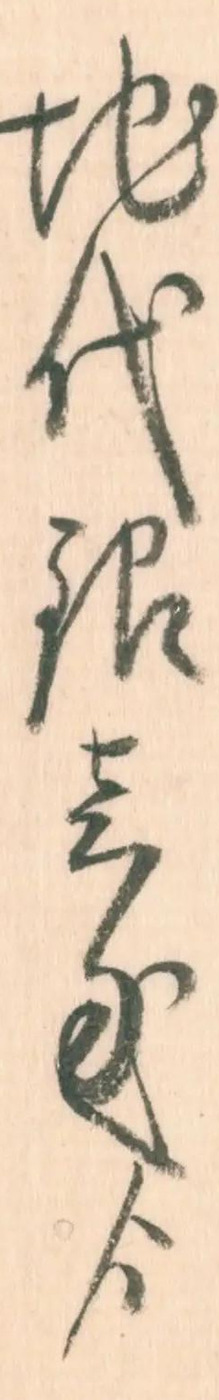地代銀壱匁ゟ
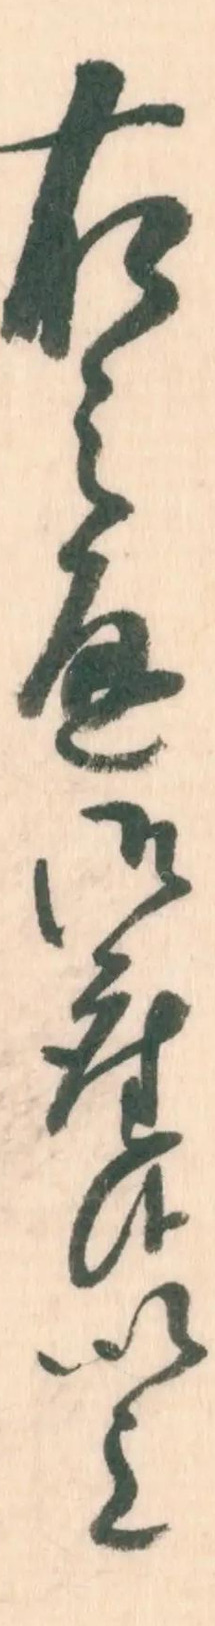右之通御座候以上
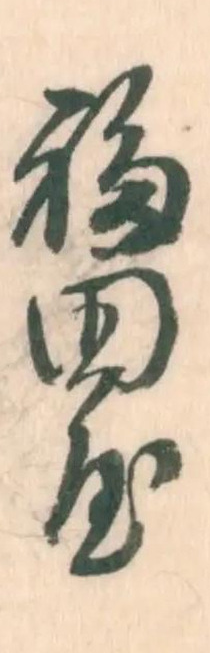福田屋
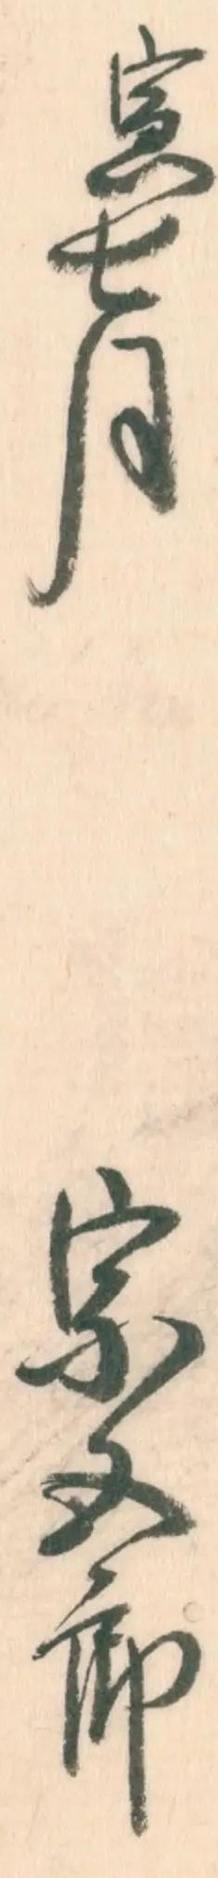寅七月宗五郎

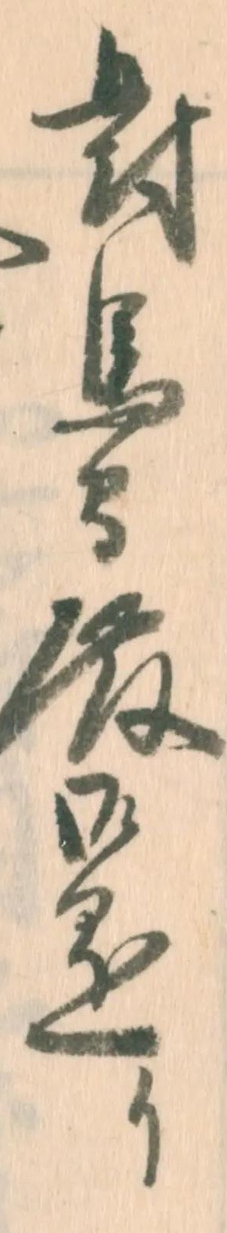対馬守殿御懸り
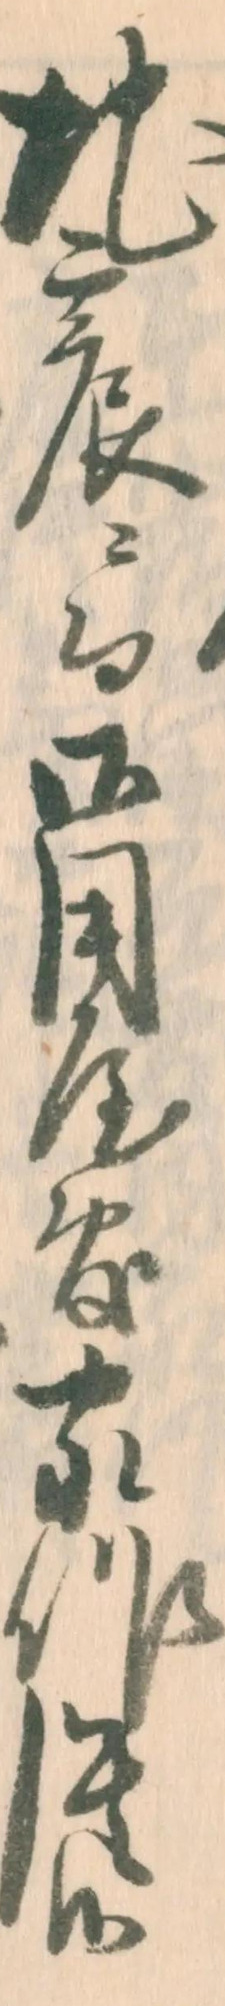地震ニ而御用屋敷家作潰候
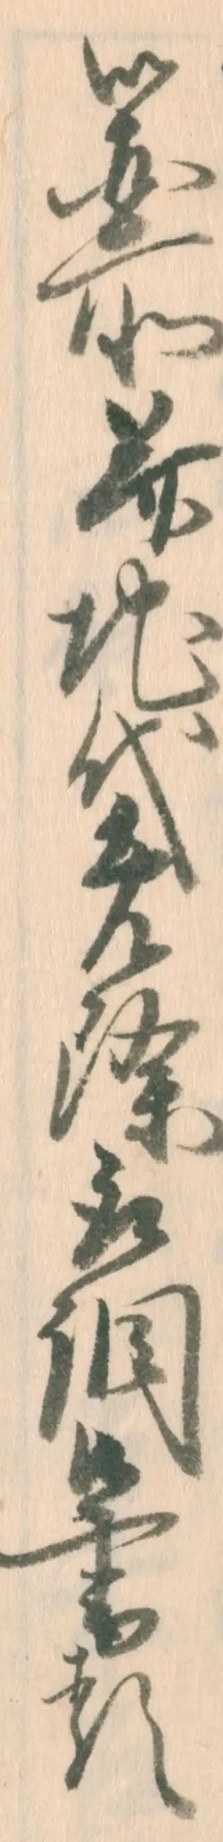箇所并地代免除取調候書類
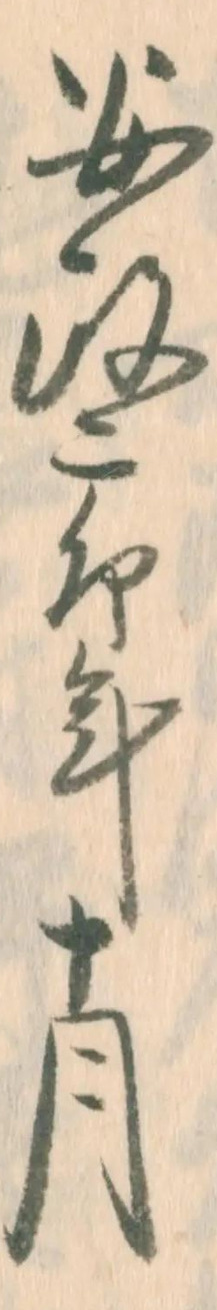安政二卯年十月

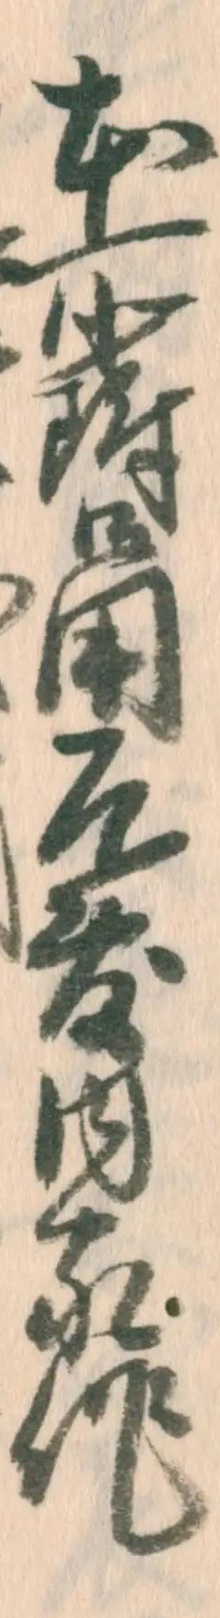本所附御用屋敷内家作
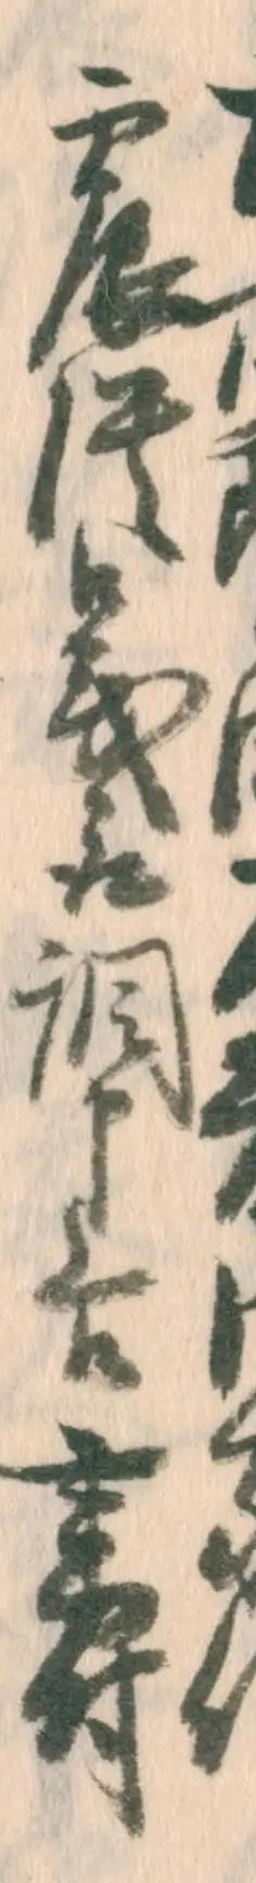震潰候義取調申上候書付
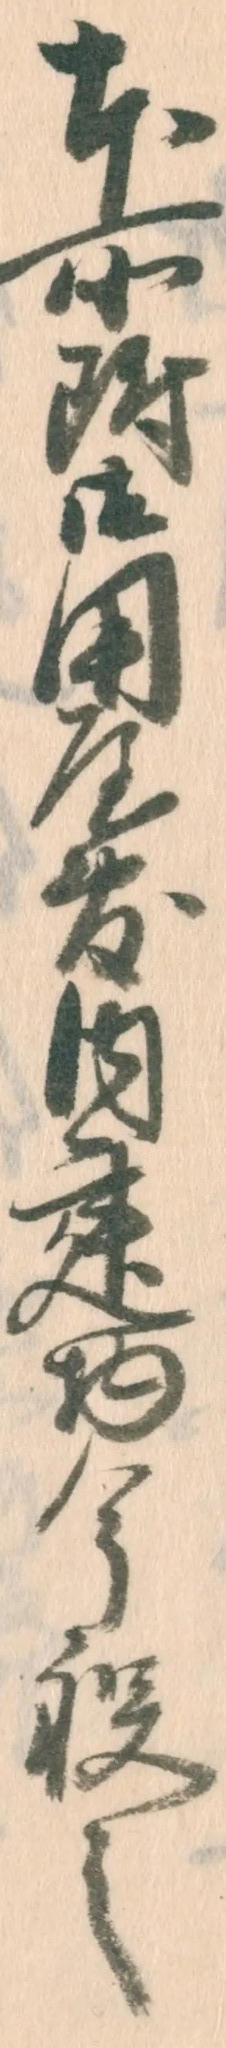本所附御用屋敷内建物今般之
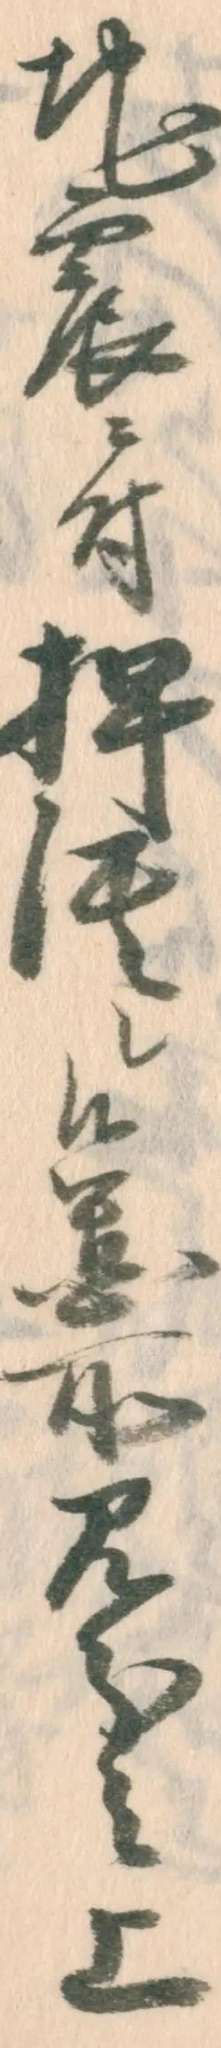地震ニ付押潰レ候箇所見分之上
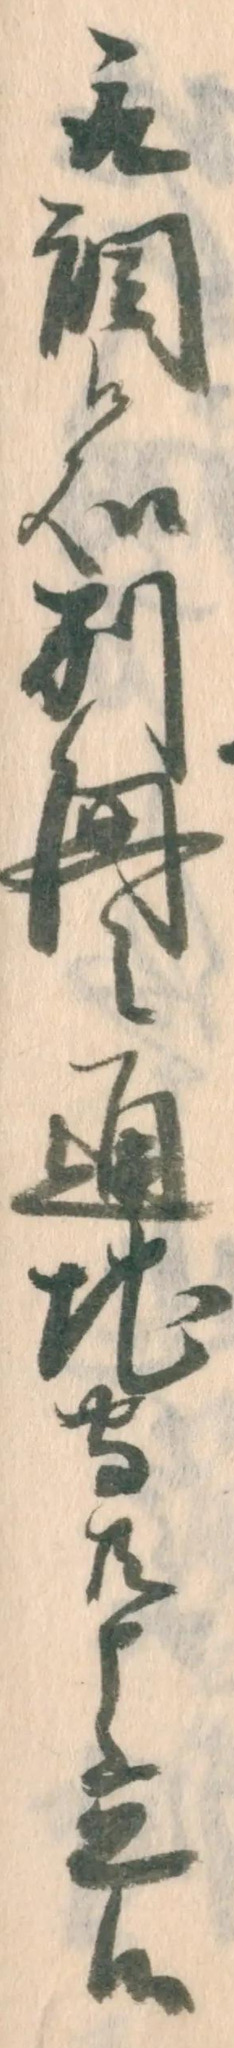取調候処別冊之通地守共申立候

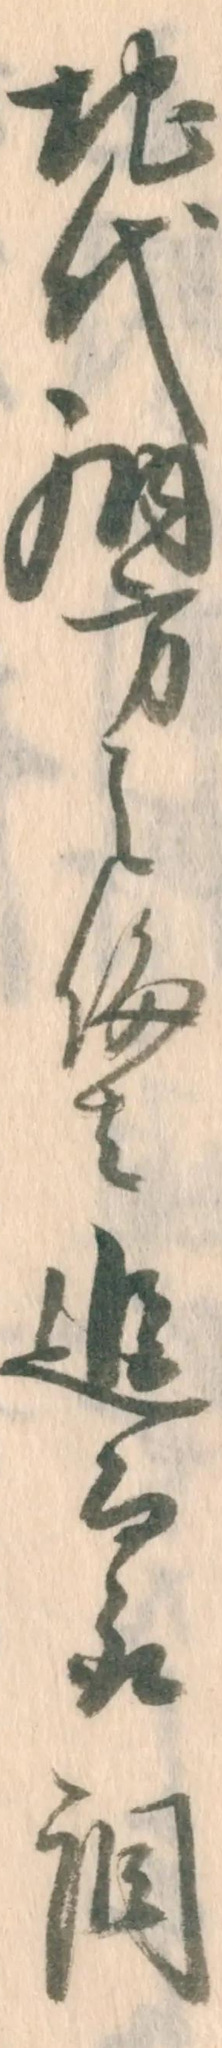地代納方之儀は追而取調
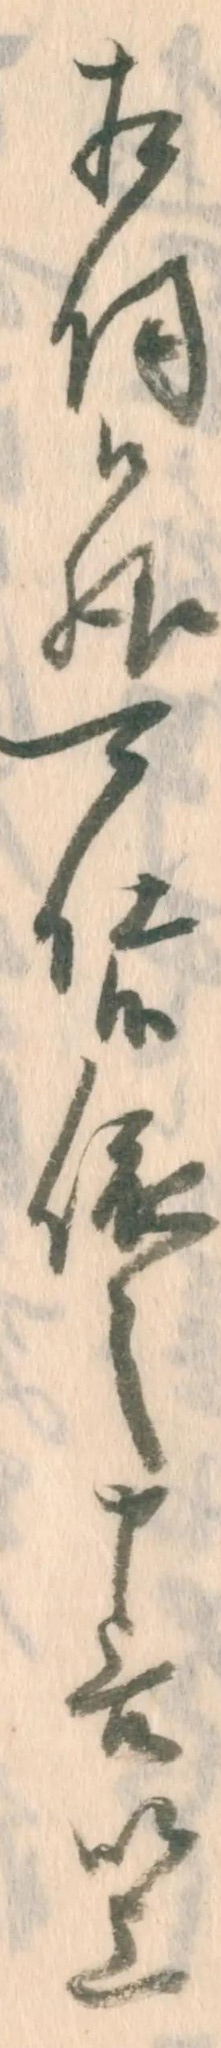相伺候様可仕候依之申上候以上
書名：地震災書留 2巻. [1] 内表紙に「地震災書留　安政二卯年　但本所深川御用屋敷地代免除調」とあり
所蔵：国立国会図書館 National Diet Library, JAPAN
